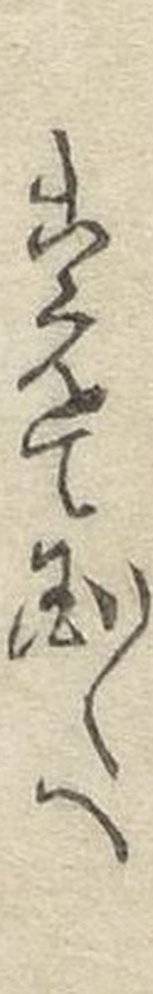こえて国〳〵へ
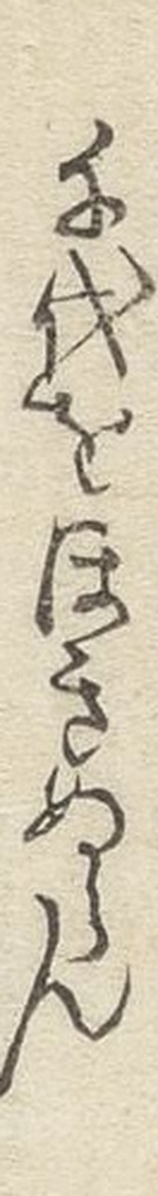千代をほきぬらん
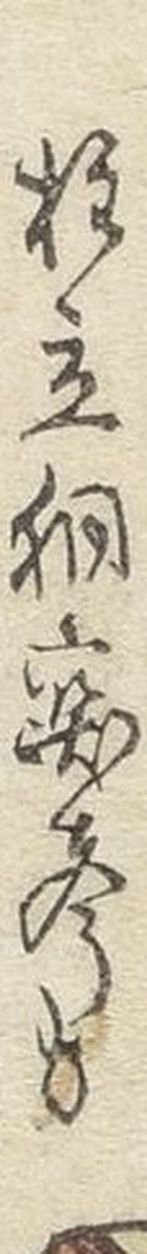柱立胴突聲も
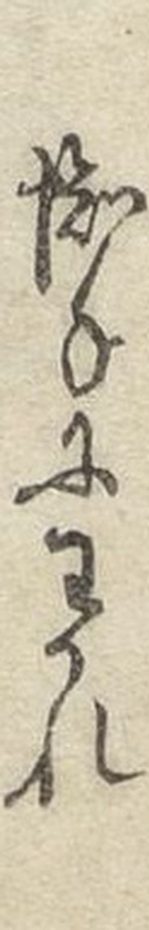蜘手にわかれ
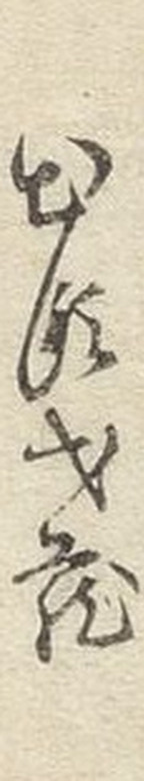出す才蔵
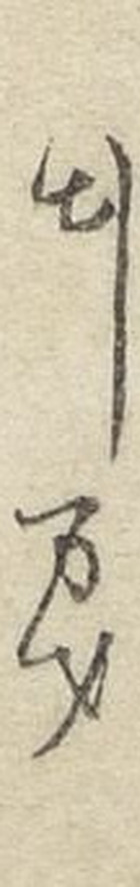出し万才
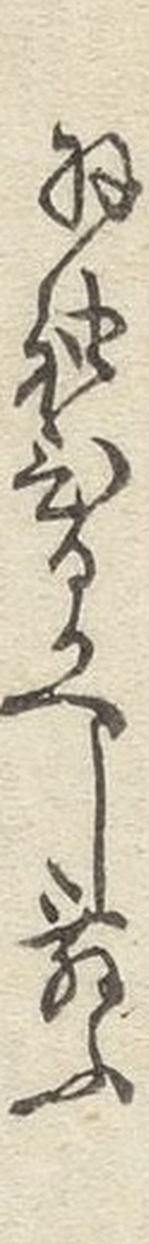羽袖ひるかへし舞ふ
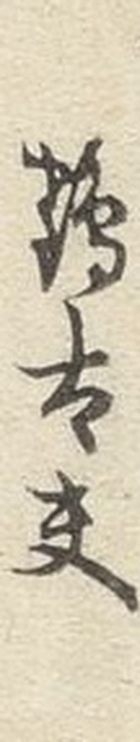鶴太夫
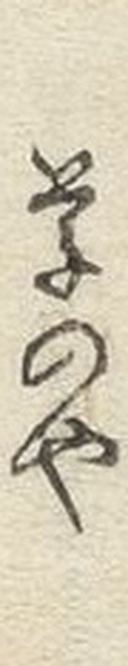草のや
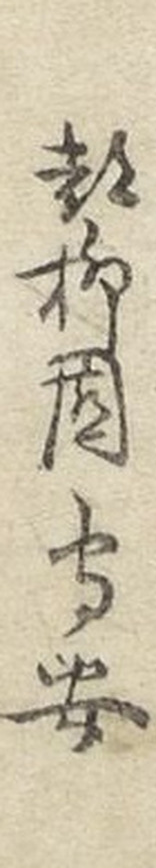都柳園守安
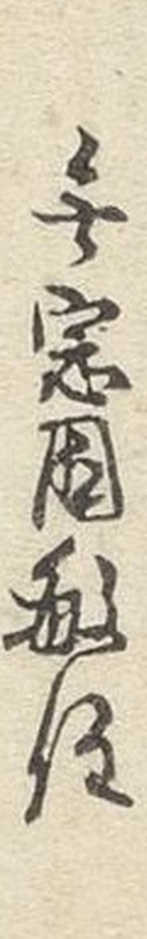無窓園敏住
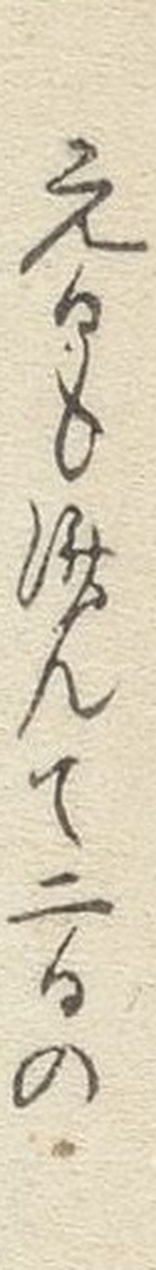元日も済んで二日の
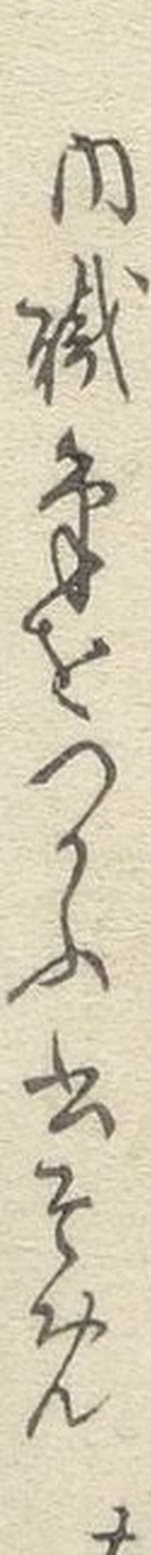内職筆をつかふ書そめ喜楽
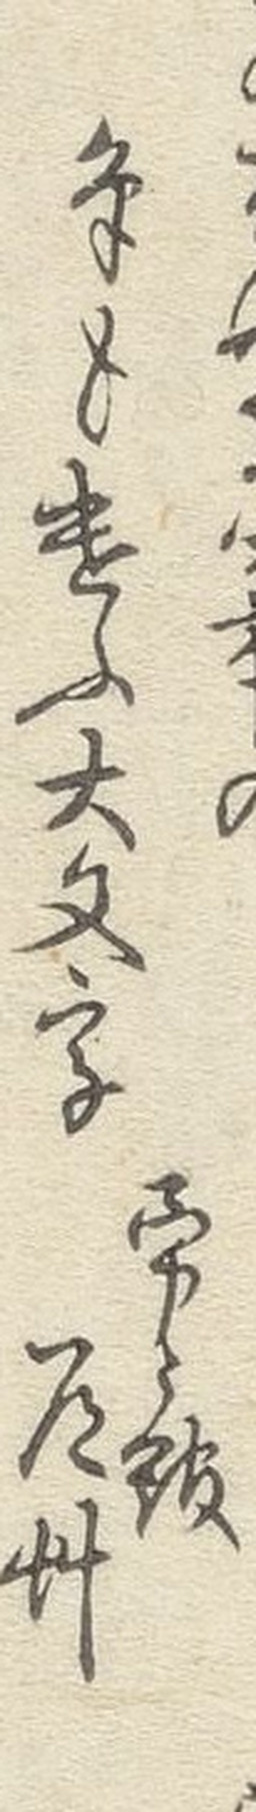筆も遣ふ大文字道草
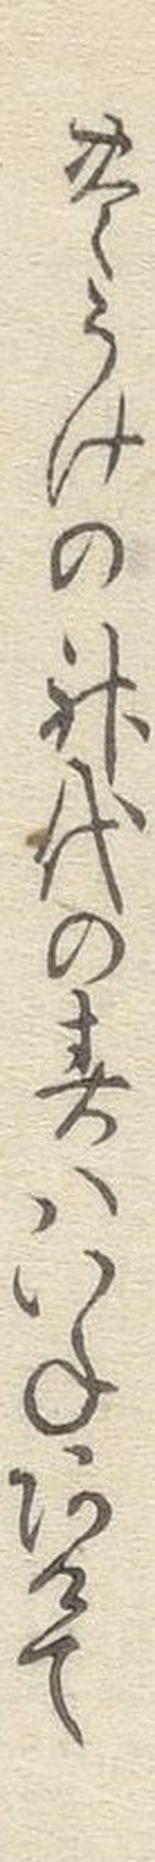豊うけの神代の春はいねあけて
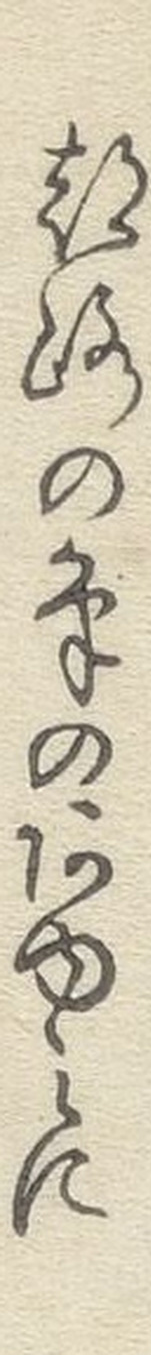都路の筆のあゆみに
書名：Picture Album of People with Kyōka (Light Verse) (Kyōka shiki jinbutsu 狂歌四季人物)
